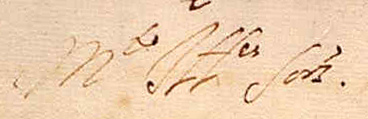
Mto Il̄l.es Sors̄.
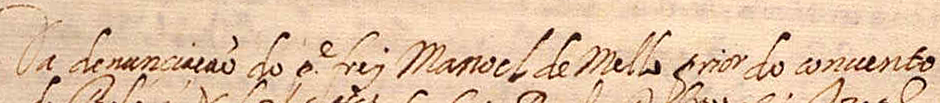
Da denunciaçaõ do pe frej Manoel de Mello prior do conuento
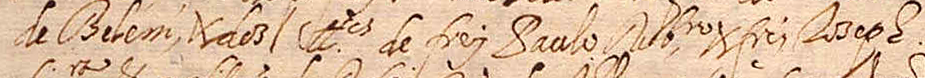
de Belem, & dos tt.os de frej Paulo Ribro, & frei Iozeph.
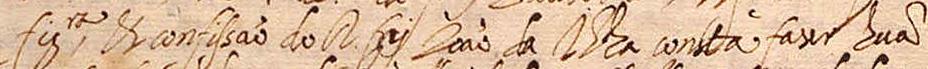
figra, & confissaõ do R frej Joaõ da Ilha consta faser huā
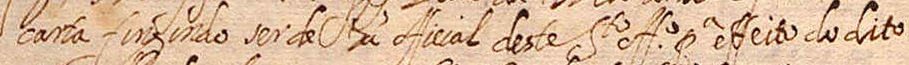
carta fingindo ser de hū official deste Sto off.o p.a effeito do dito
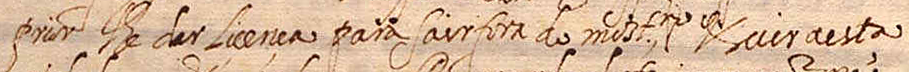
prior lhe dar licença para Sair fora do most.ro, & uir a esta
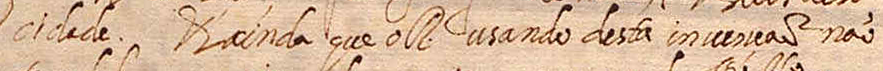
cidade. & ainda que o R. usando desta inuençaõ naõ
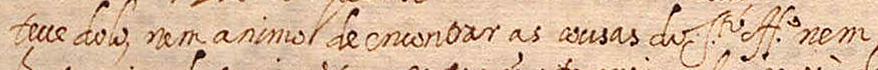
teue dolo, nem animo de encontrar as cousas do S.to off.o nem
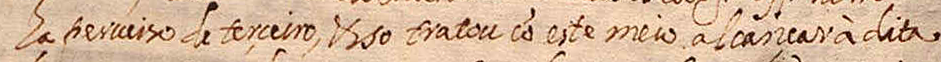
ha periuiso de terceiro, & so tratou cō este meio alcançar à dita
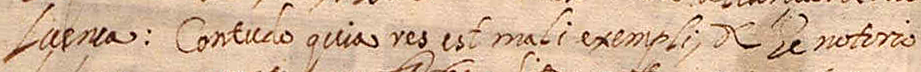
Licença: Contudo quia res est mali exempli, & he notorio
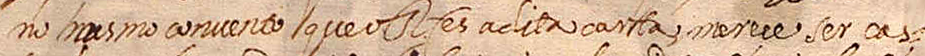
no mesmo conuento que o R fes a dita carta, merece ser cas
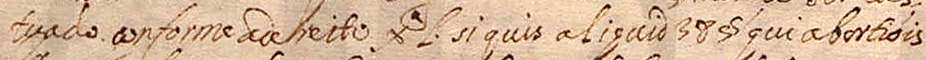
tigado conforme a dereito xa l. si quis aliquid 38 § qui abortiōis
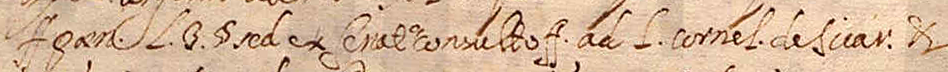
ff pæn. l. 3. § sed ex Senato consulto ff. ad l. cornel. de Suar. &
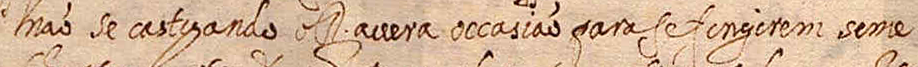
naõ se castigando o R. auera occasiaõ para se fingirem seme
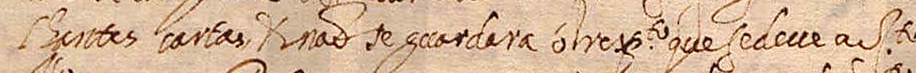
lhantes cartas, & naõ se guardara ó resp.to que se deue ao S.to
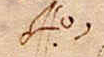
off.o,
